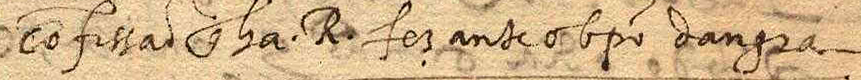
co̅fissão q̅ ha .R. fez ante o bpo̅ dangra
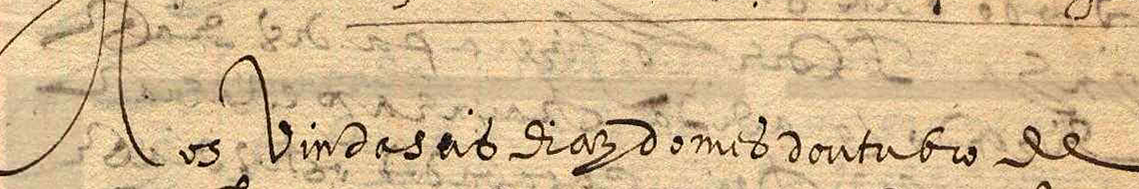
Aos Vinta seis diaz do mes doutubro de
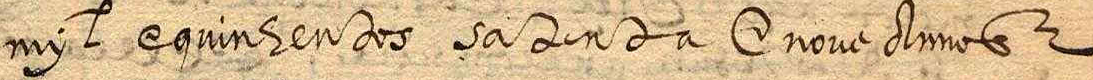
myl e quinhentos satenta e noue Annos
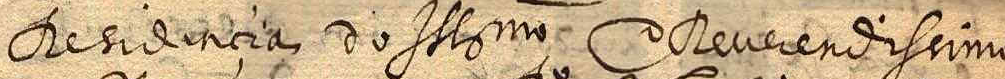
Residençia do Jllsmo e Reuerendissimo
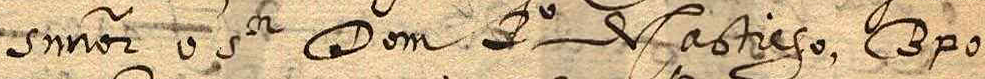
snn̅or o s.or Dom Po de Castilho, Bpo
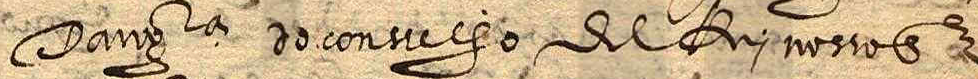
Dangra. do consselho del Rey nosso sor
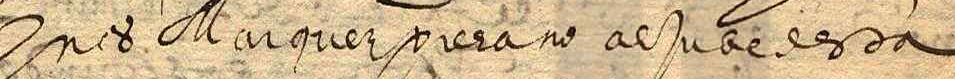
Jnes Marquez preza no aljube desta
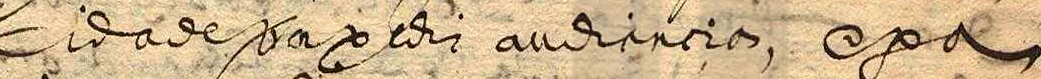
cidade ꝟ a pedir audiençia, e ꝑa
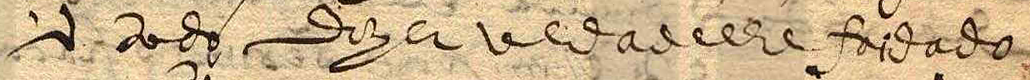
e̅ todo dizer verdade lhe foi dado
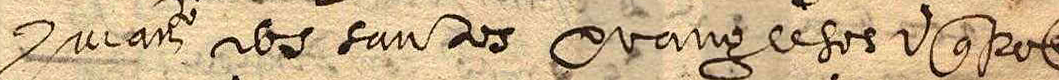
Juramto dos santos evangelhos e̅ q̅ pos
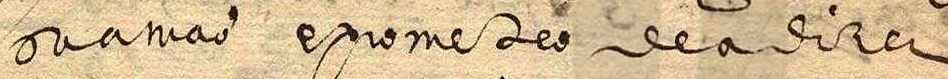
sua mão e prometeo de a dizer
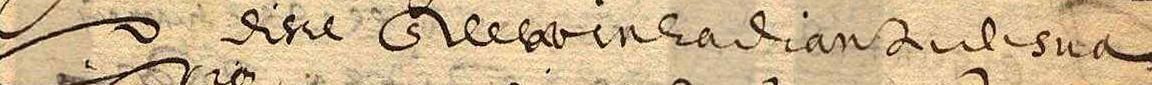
e disse q̅ ellla vinha diante de sua
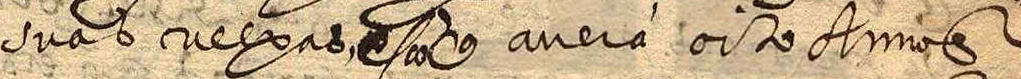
suas cullpas, e co̅ q̅ auerá oito Annos
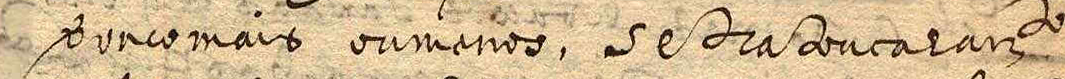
pouco mais ou menos, se tratou cazamto
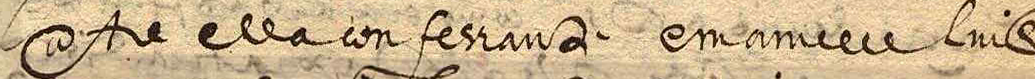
a̅tre ella confessante e manuell Luis
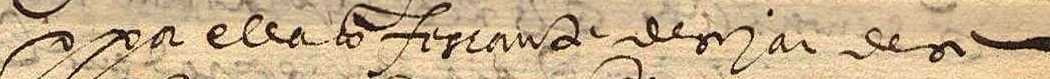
e por ella co̅fessante desejar de se
